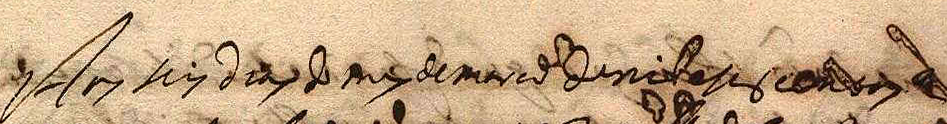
Aos seis dias do mes de março de mil e sescentos e
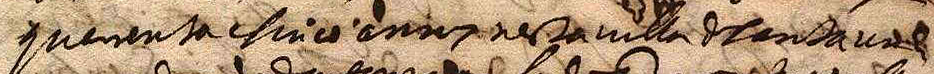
quarenta e sinco annos nesta uilla d santarem
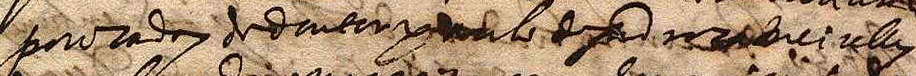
pouzadas do doutor paulo de pedroza meirelles
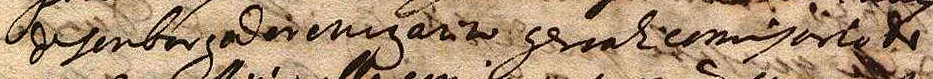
desenbargador e uigairo geral comisario do
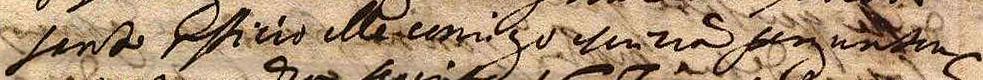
santo officio elle comigo escriuaõ perguntou
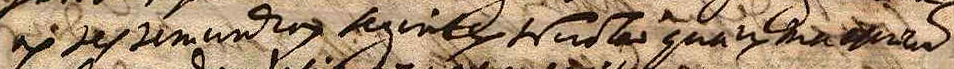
as testemunhas segintes Nicolao quaresma escriuā
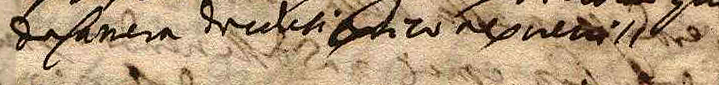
da Camera do eclesiastico o escreui //
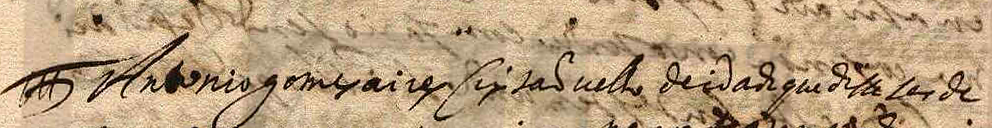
item Antonio gomes aires Cristaõ uelho de idade que disse ser de
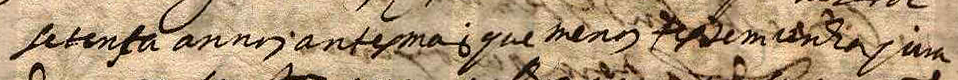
setenta annos antes mais que menos testemunha jura
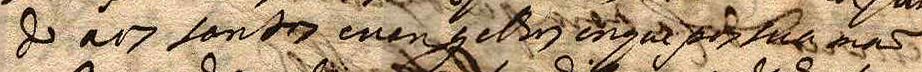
do aos santos euangelhos en que pos sua maõ
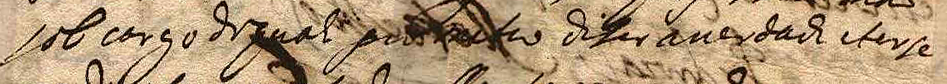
sob cargo do qual prometeo diser a uerdade e ter se
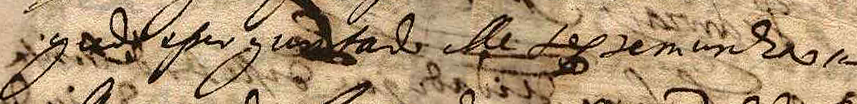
gredo e perguntado elle testemunha //
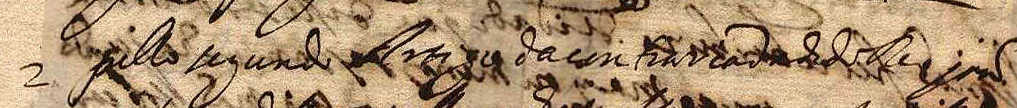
2 pello segundo Artigo da contrariadade do Reo joaõ
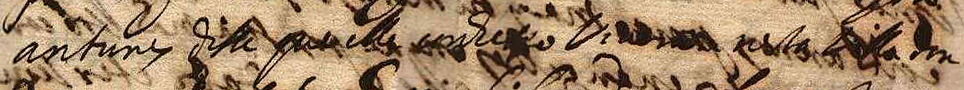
antunes disse que elle conheseo Viueram nesta villa don
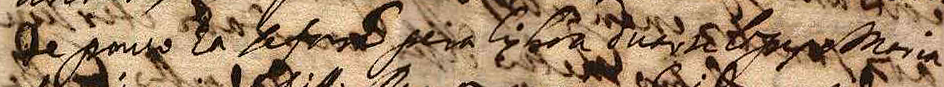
de pouco ha se foraõ pera lisboa duarte lopes e Maria
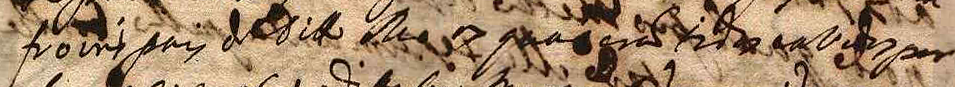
froins pais do ditto Reo os qua_ eraõ tidos e avidos por
